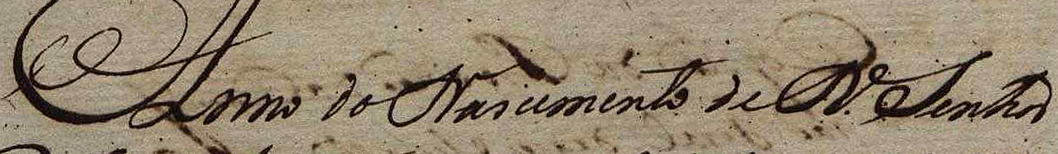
Anno do Nascimento de N. Senhor
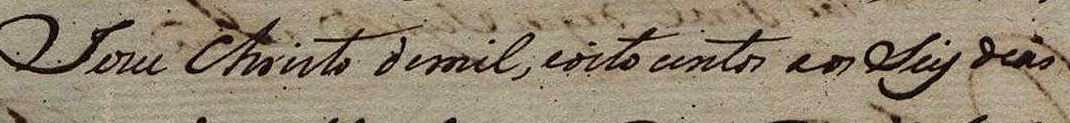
Iesu Christo de mil, e oitocentos aos Seis dias
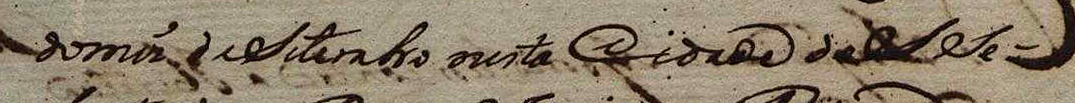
do méz de Setembro nesta Cidade de S. Se
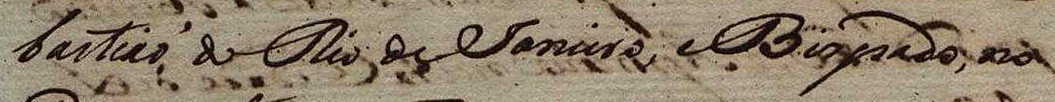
bastiaõ do Rio de Ianeiro, e Bispado, no
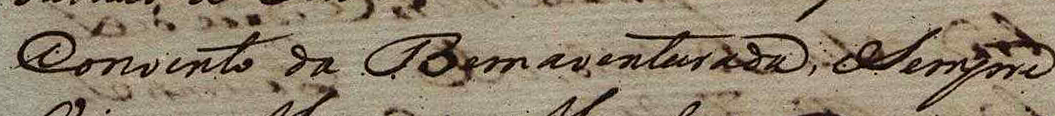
Convento da Bemaventurada, e Sempre
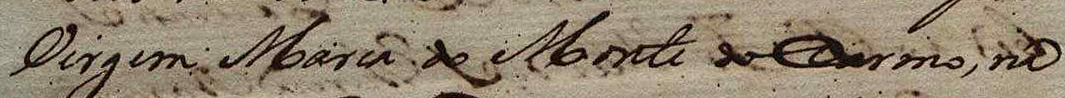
Virgem Maria do Monte do Carmo, na
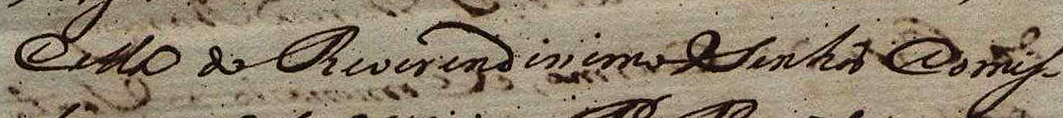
cella do Reverendissimo Senhor Comis
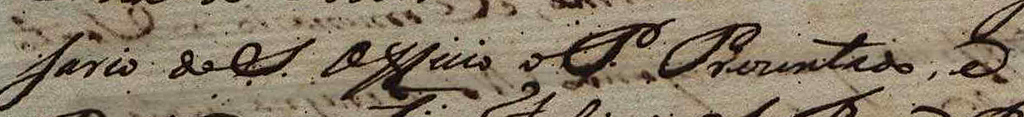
sario do S. Officio o P. Prezentado, e
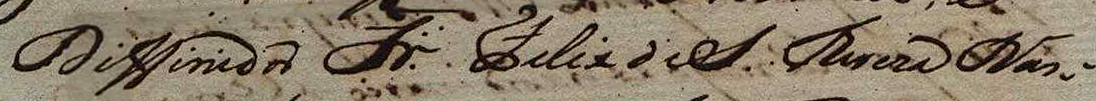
Diffinidor Fr. Felix de S. Thereza Nas
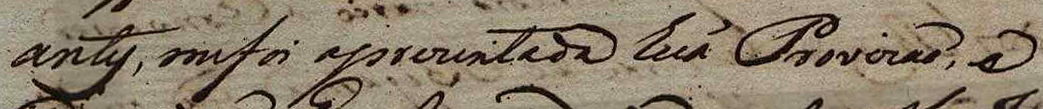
centes, me foi aprezentada huā Provizaõ, e
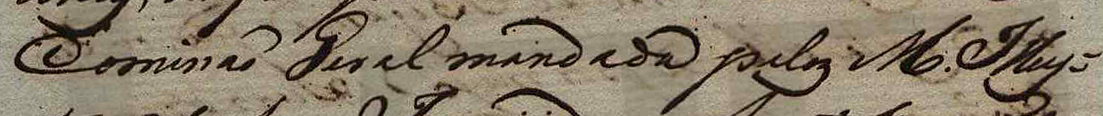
Comissaõ Geral mandada peloz M. Ilus
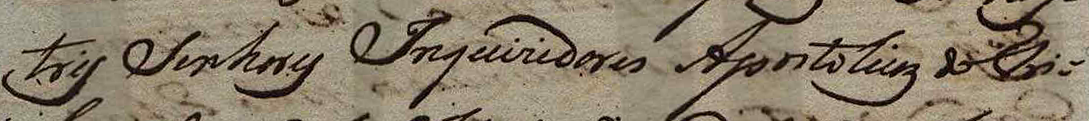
tres Senhores Inquizidores Apostolicoz do Tri
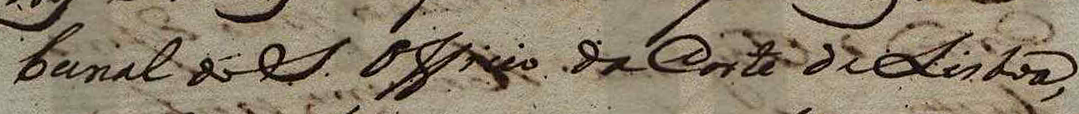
bunal do S. Officio da Corte de Lisboa,
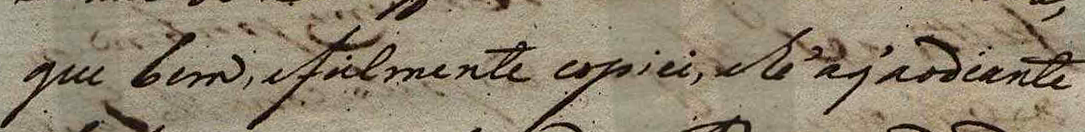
que bem, e fielmente copiei, e hé a q̄ aodiante
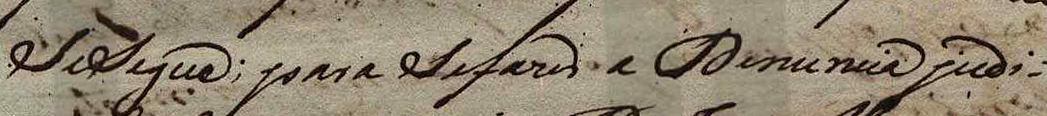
Se Segue; para Se fazer a Denuncia judi
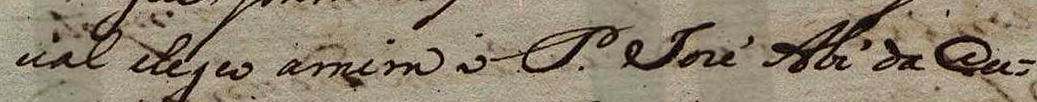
cial elegeo a mim o P. Iosé Alz̄ da Cu
